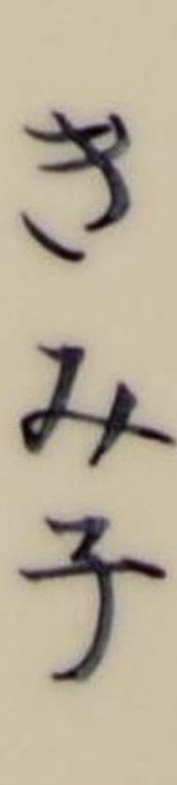きみ子
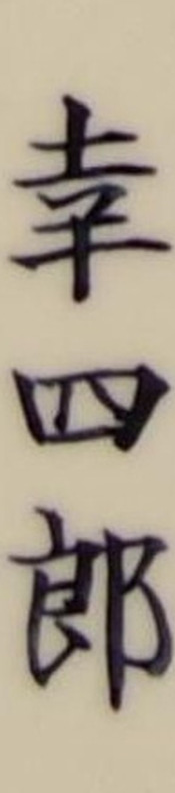幸四郎
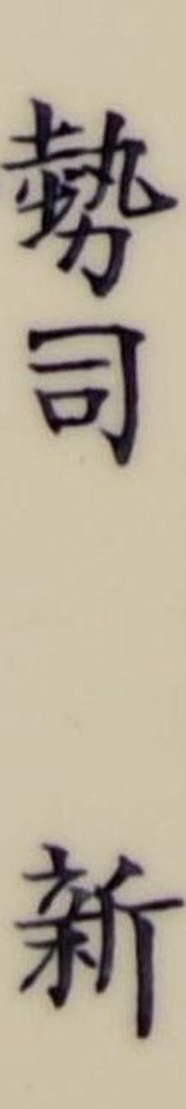勢司新
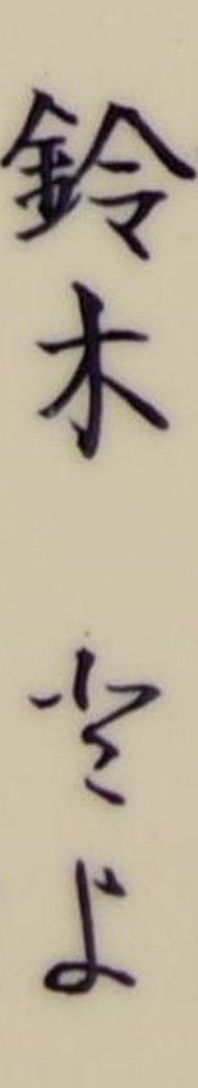鈴木とよ
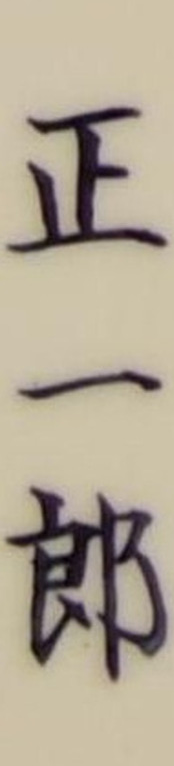正一郎
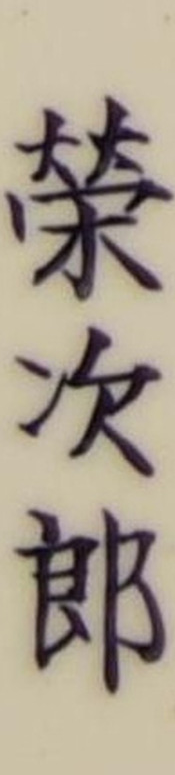榮次郎
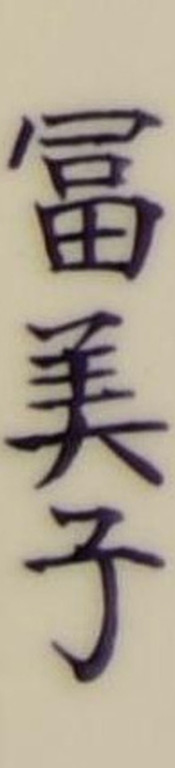冨美子

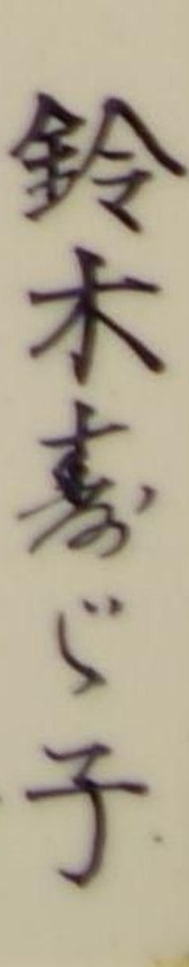鈴木すず子
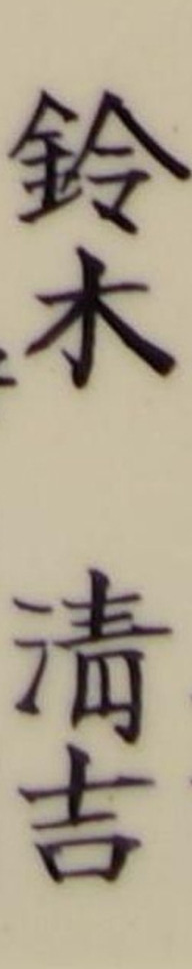鈴木清吉
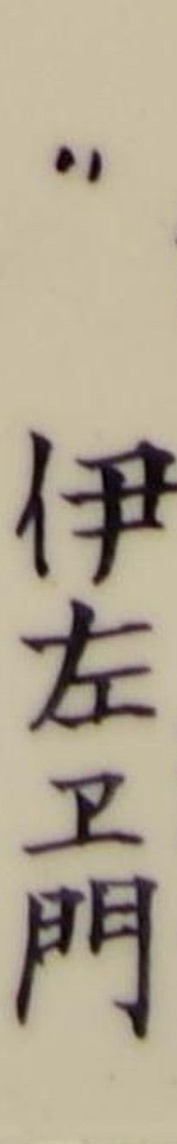伊左ヱ門
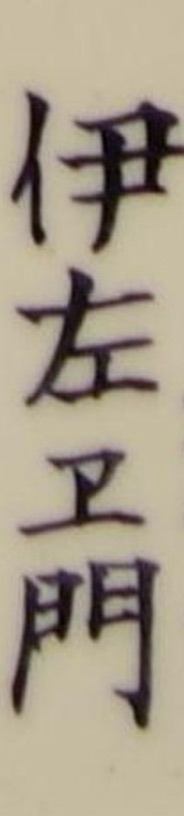伊左ヱ門
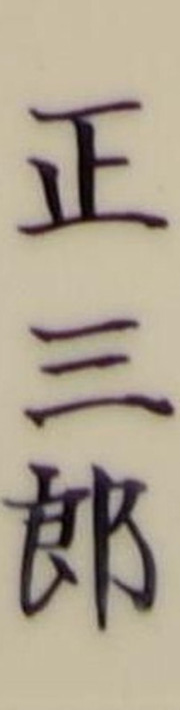正三郎
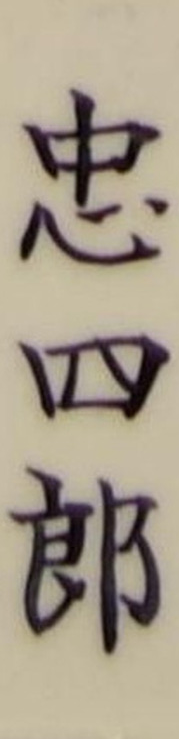忠四郎
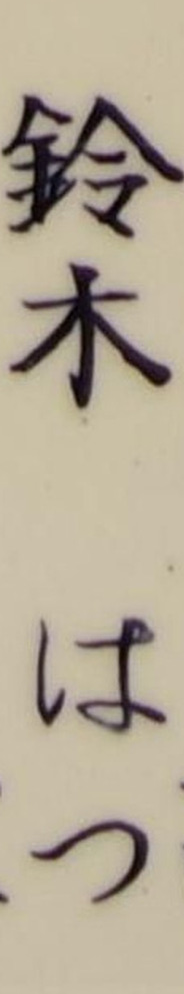鈴木はつ
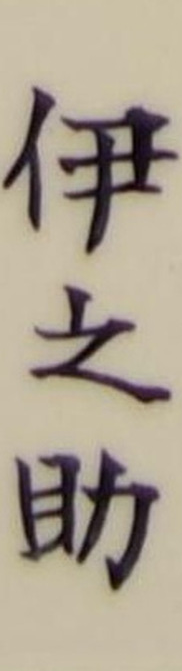伊之助
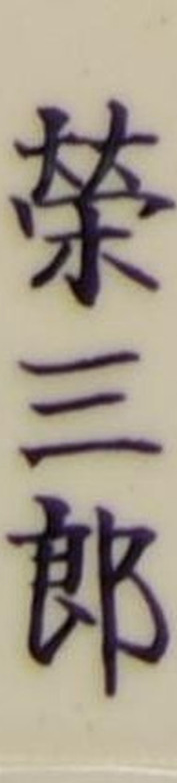榮三郎
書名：A~D
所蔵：koyasan kongobuji
